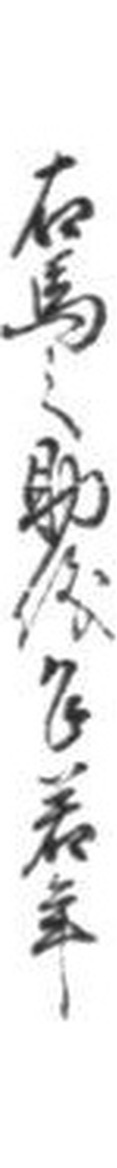右馬之助儀乍若年
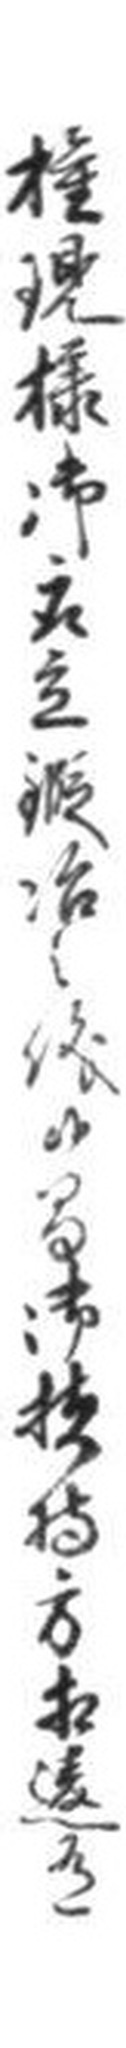権現様御取立鍛冶之儀候間御扶持方相違有
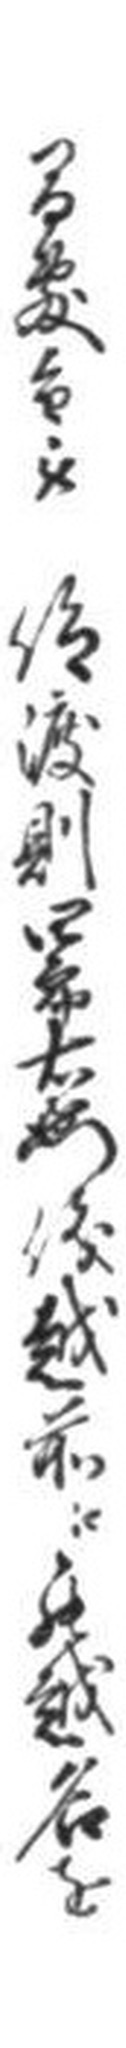間敷旨被仰渡則四郎右衛門儀越前江罷越名を
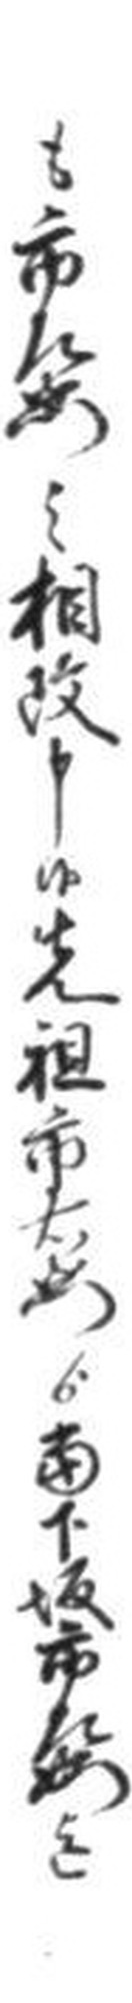も市左衛門与相改申候先祖市右衛門ゟ当下坂市左衛門迄
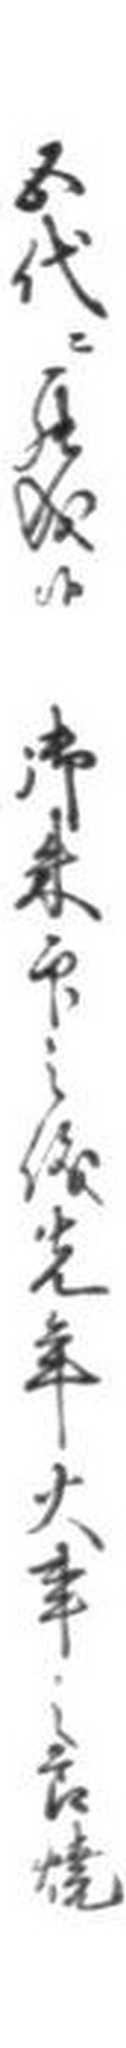五代ニ罷成候御朱印之儀先年火事之節焼
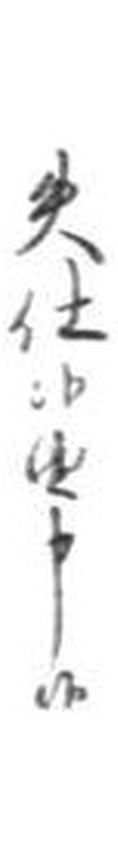失仕候由申候
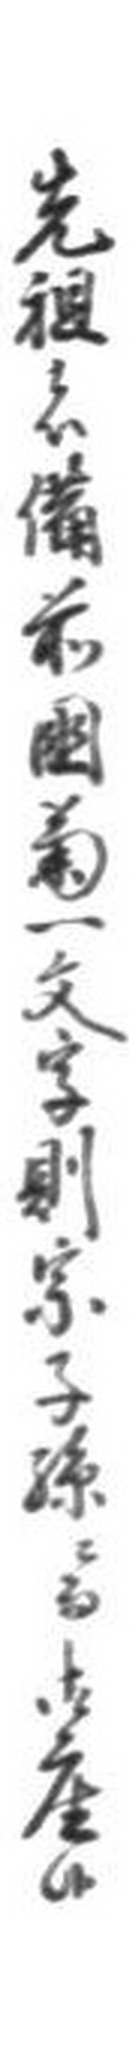先祖者備前国菊一文字則宗子孫ニ而御座候
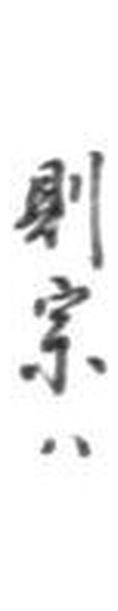則宗ハ
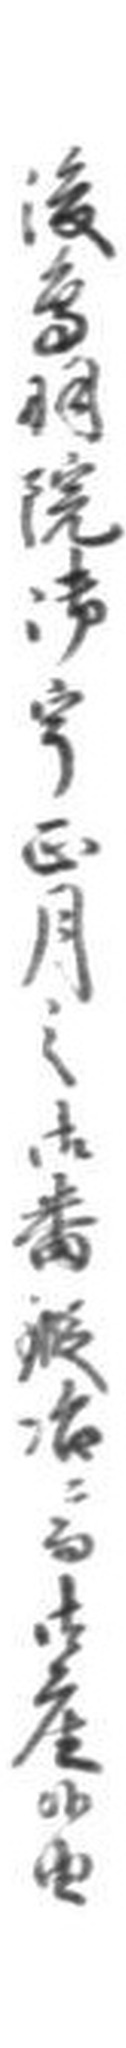後鳥羽院御宇正月之御番鍛冶ニ而御座候由
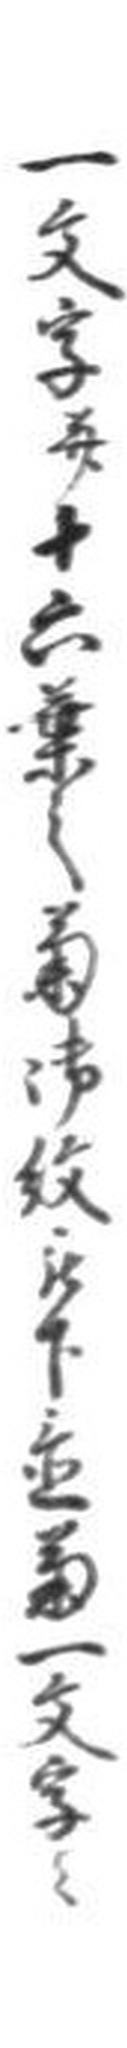一文字并十六葉之菊御紋被下置菊一文字与
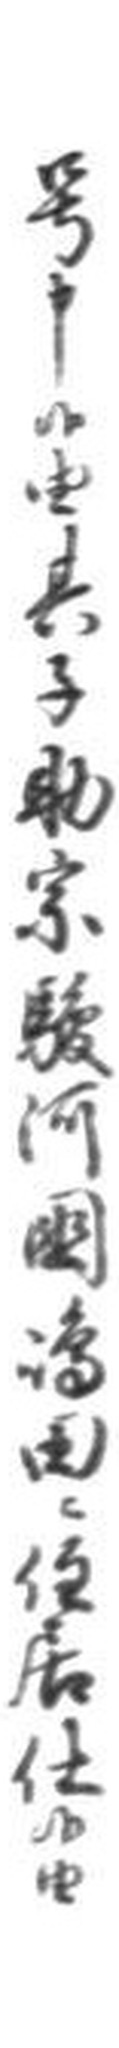号申候由其子助宗駿河国嶋田ニ住居仕候由
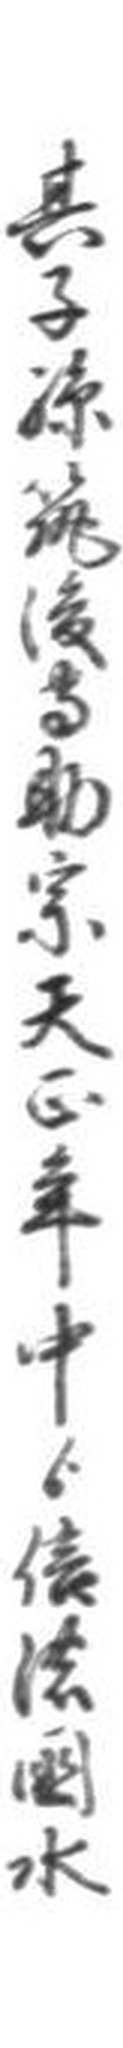其子孫筑後守助宗天正年中ゟ信濃国水
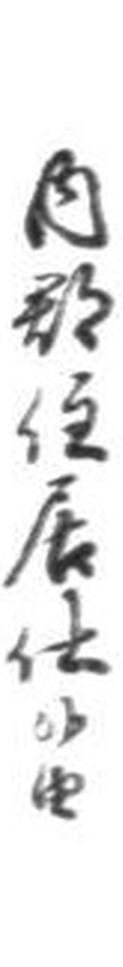内郡住居仕候由

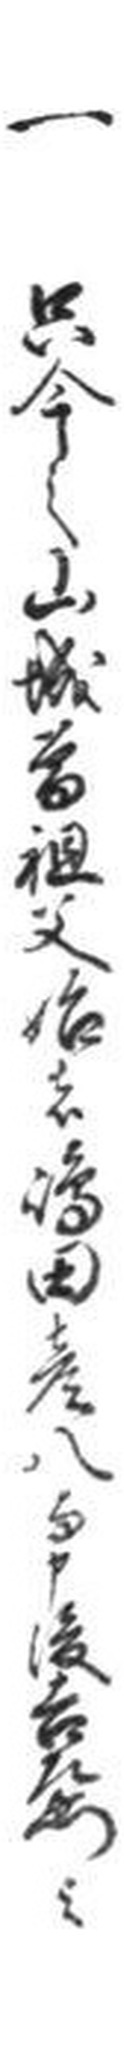一只今之山城曾祖父始者嶋田彦八与申後吉左衛門与
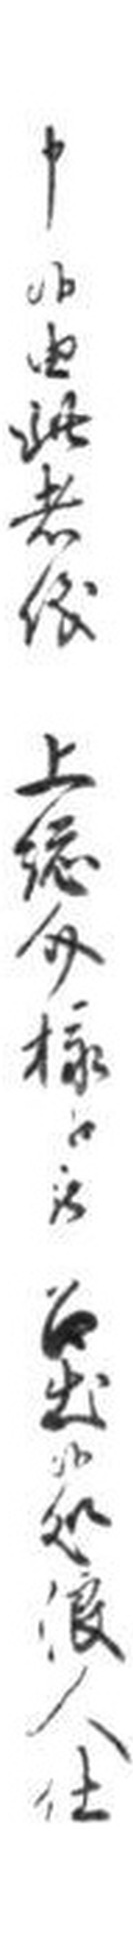申候由此者儀上総介様江被召出候処浪人仕
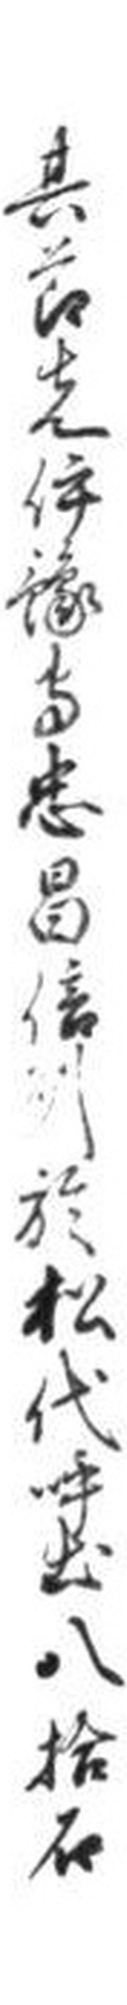其節先伊予守忠昌信州於松代呼出八拾石
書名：家譜 三十三 吉邦公 享保四年
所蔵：福井県文書館 Fukui Prefectural Archives
